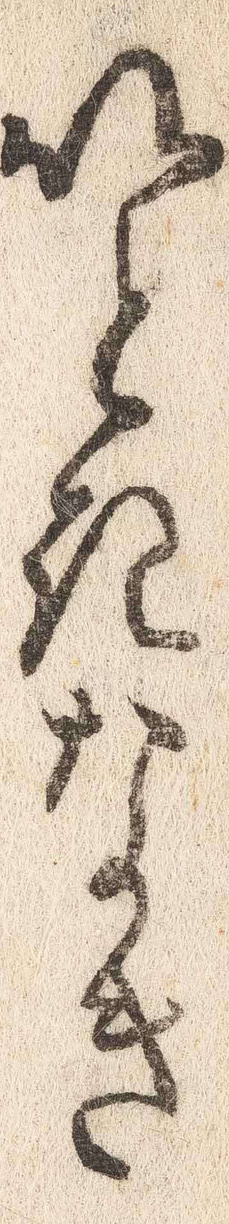いときなき
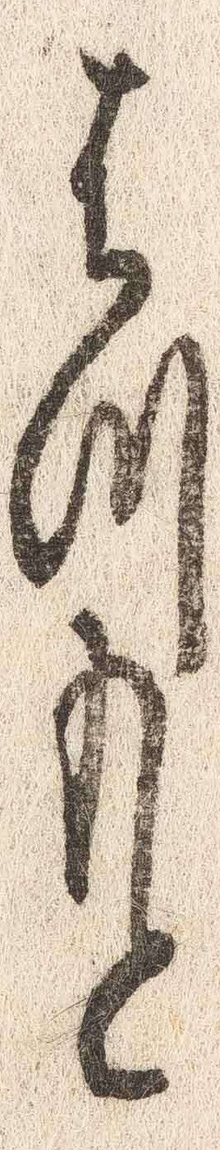はつもと
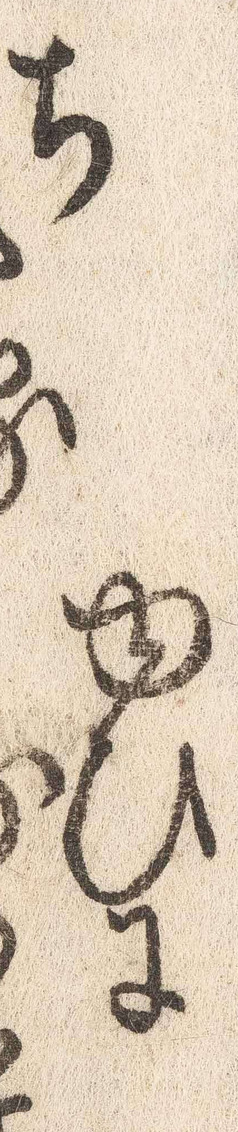ちゆひに
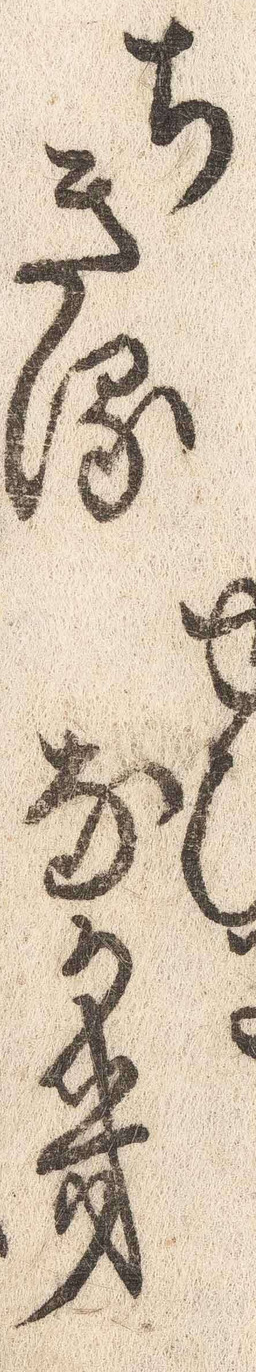きるなかき
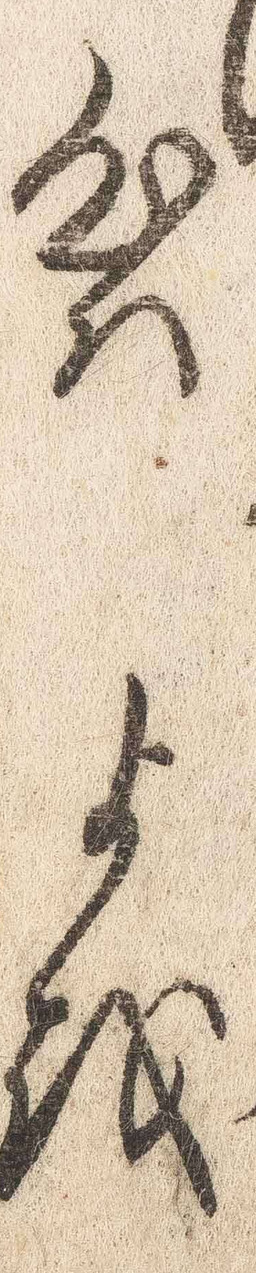心はよを
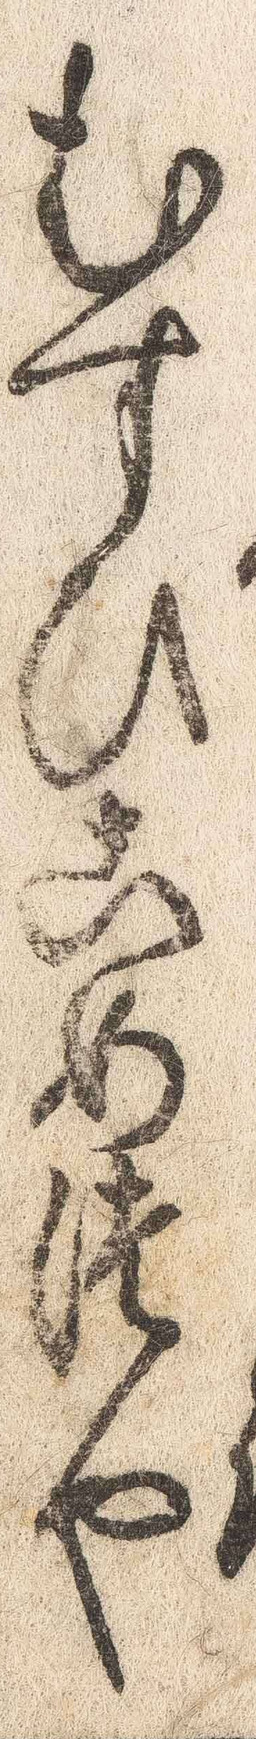むすひこめつや

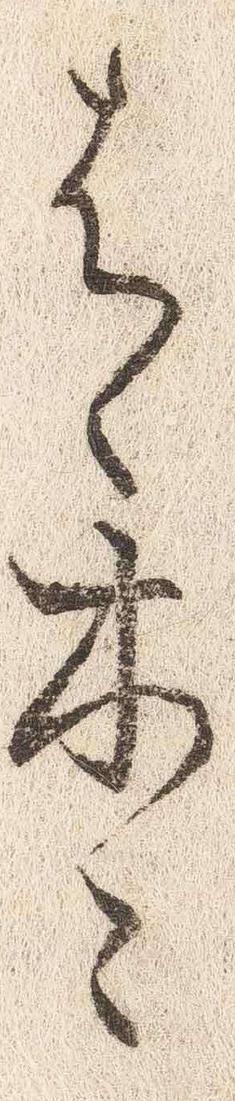はゝ木々
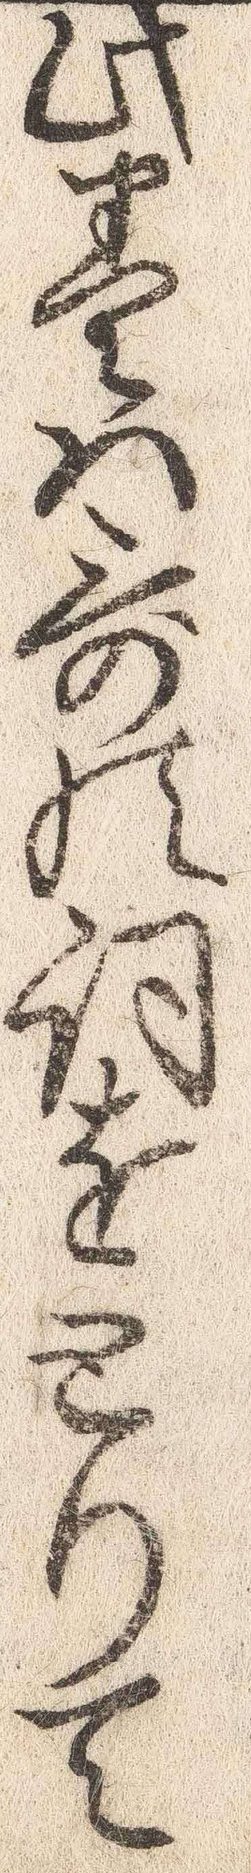此巻は歌の詞をとりて
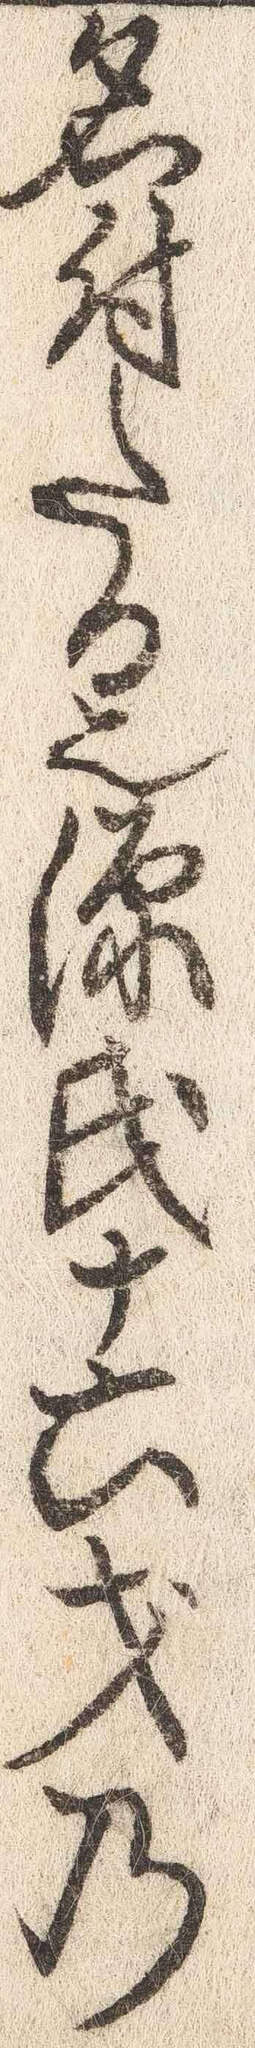名付たる也源氏十六才の
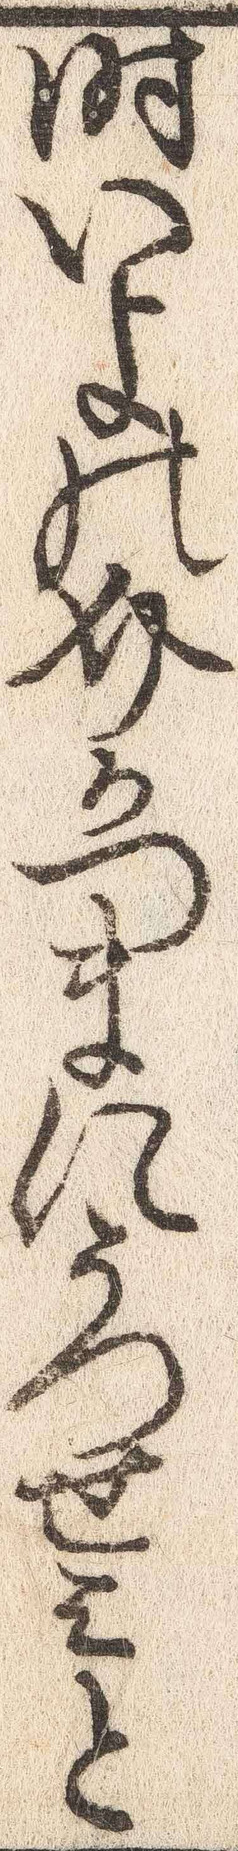時いよの介かつまにうつせみと
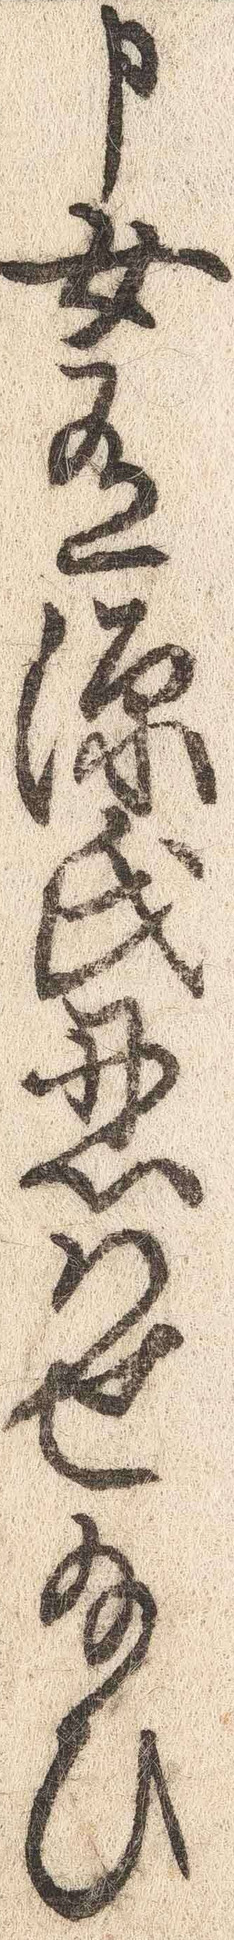申女有源氏忍はせ給ひ
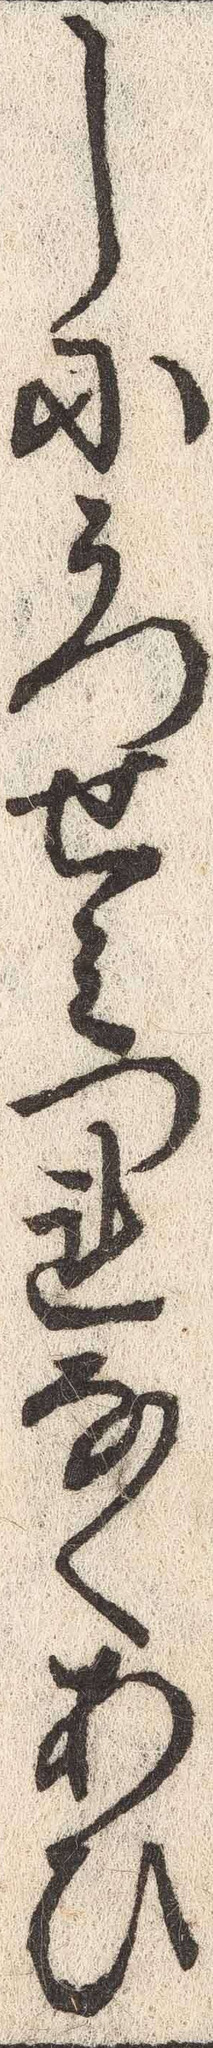しにうつせみつれなくあひ
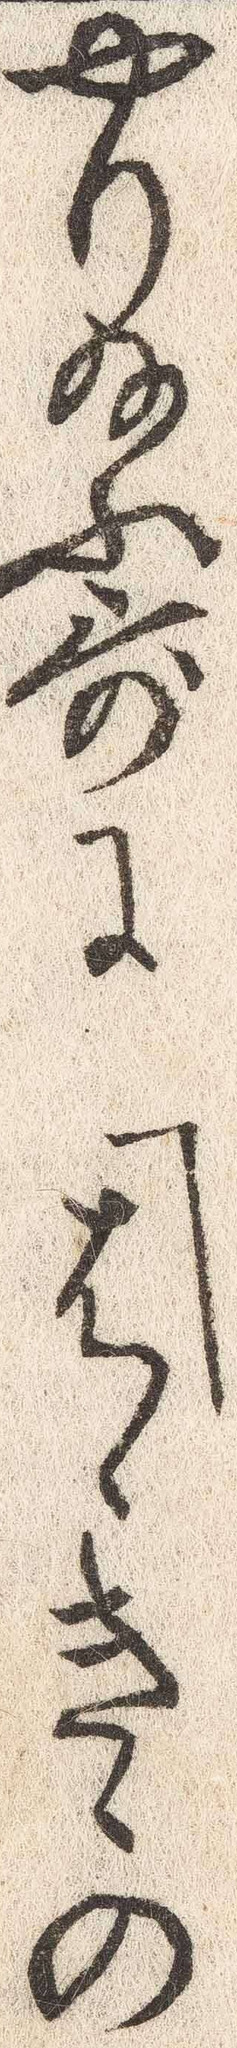やり給ふ歌に〽はゝきゝの
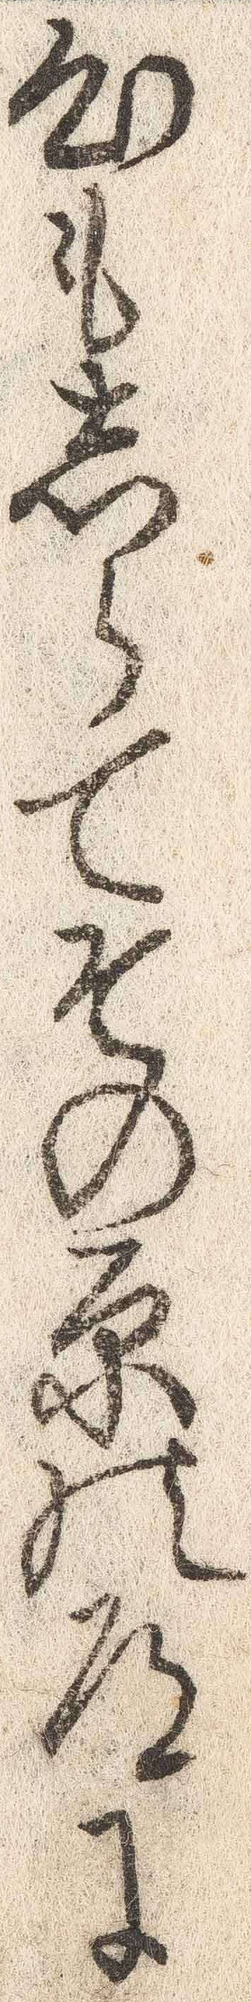心もしらてその原の道に
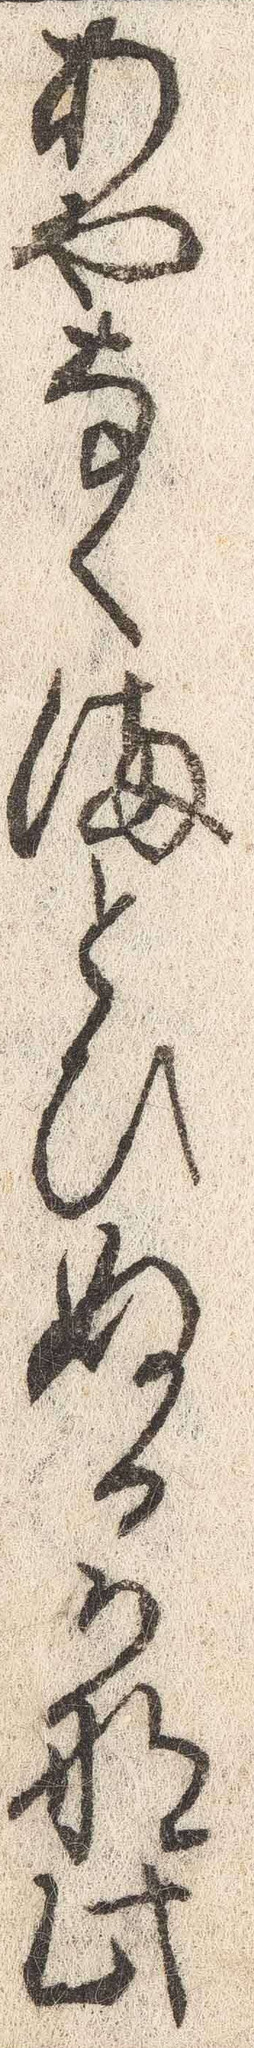あやなくまとひぬるかな此

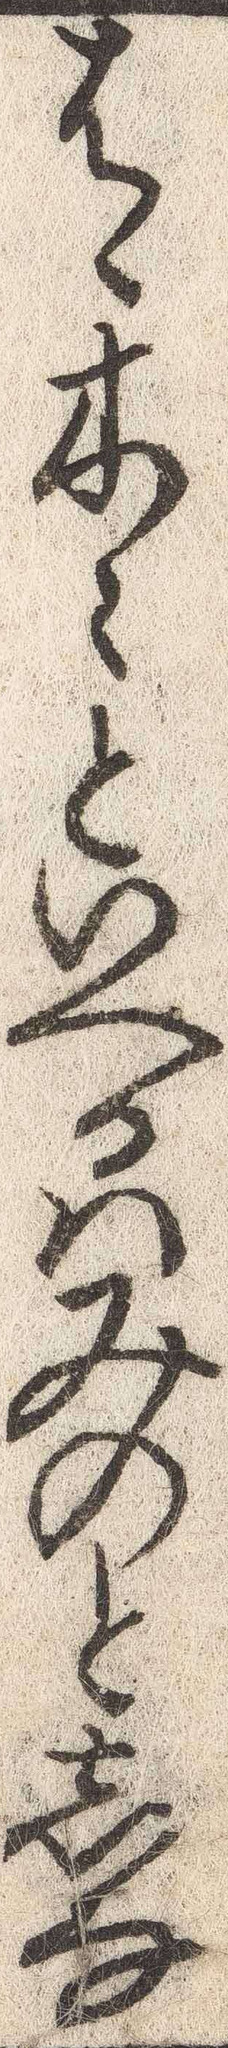はゝ木々といへるはみのとしな
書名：源氏物語
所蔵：東京学芸大学附属図書館 国文学研究資料館
